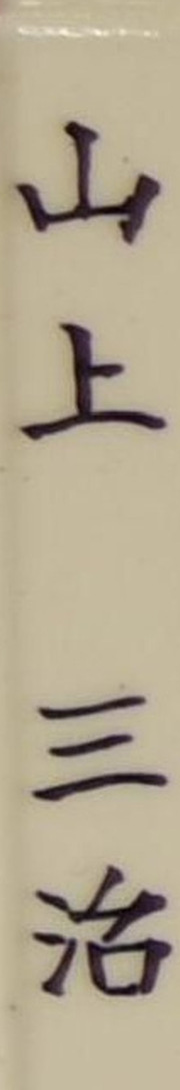山上三治

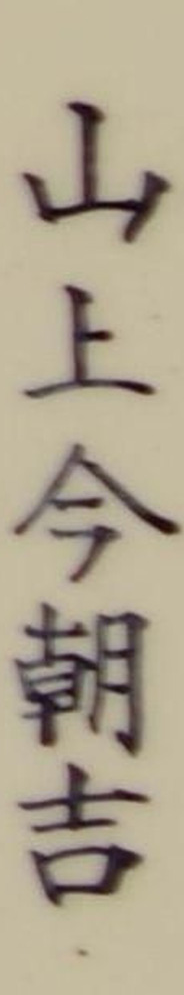山上今朝吉
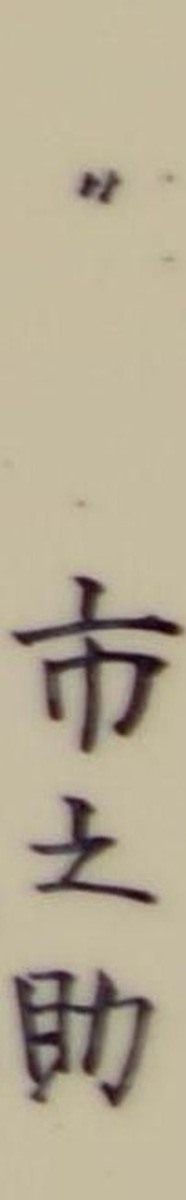市之助
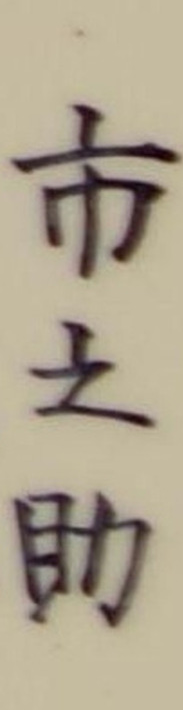市之助
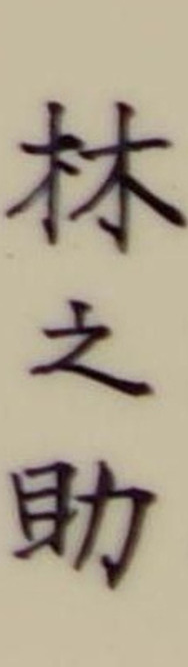林之助
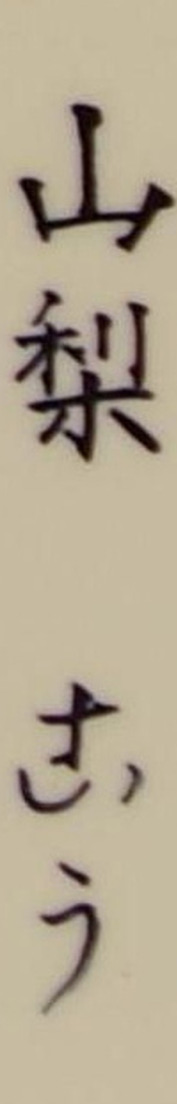山梨こう
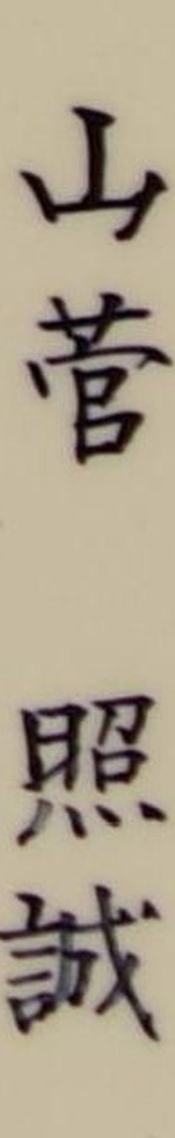山菅照誠
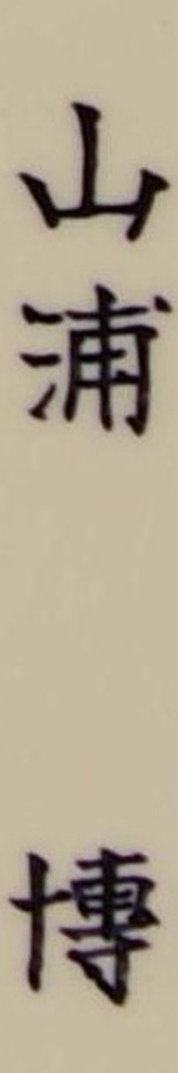山浦博
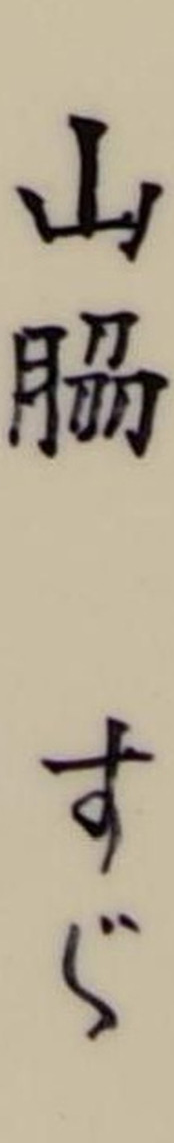山脇すず
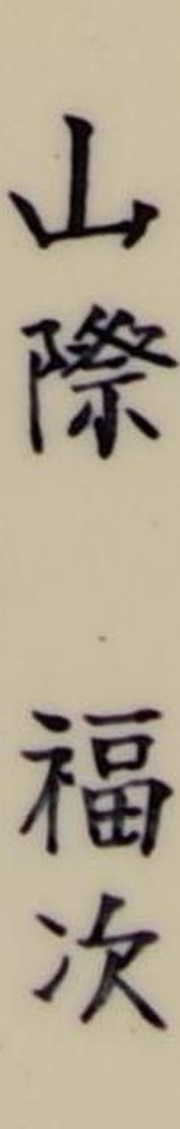山際福次
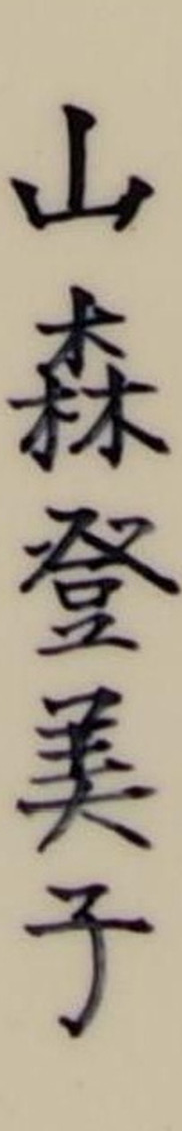山森登美子
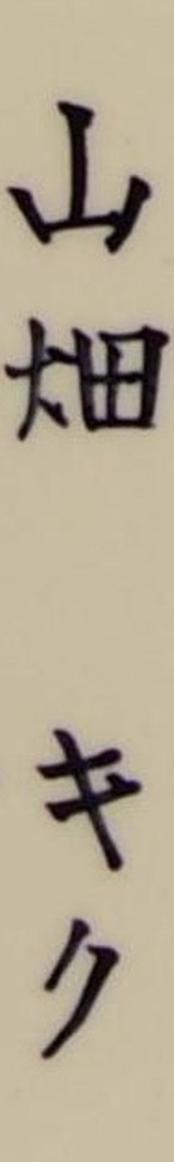山畑キク
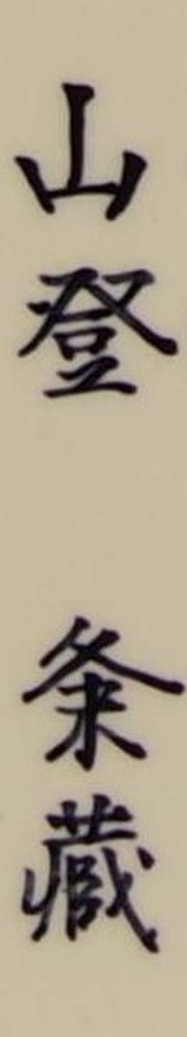山登粂蔵
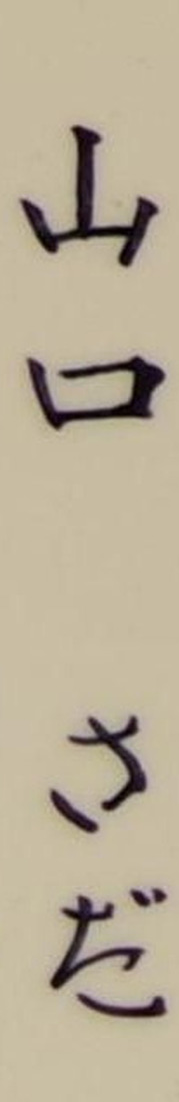山口さだ
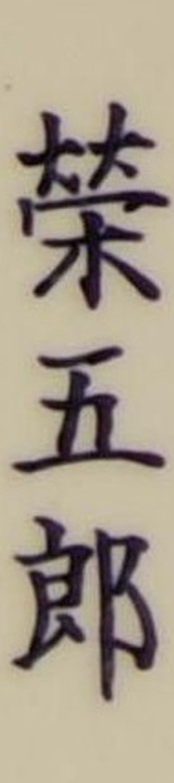榮五郎
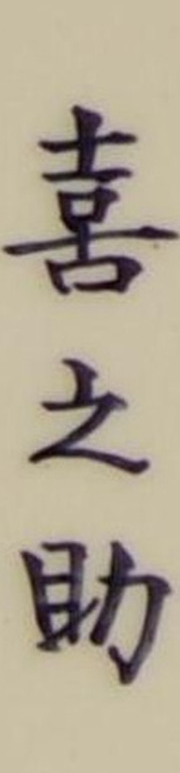喜之助
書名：A~D
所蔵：koyasan kongobuji
